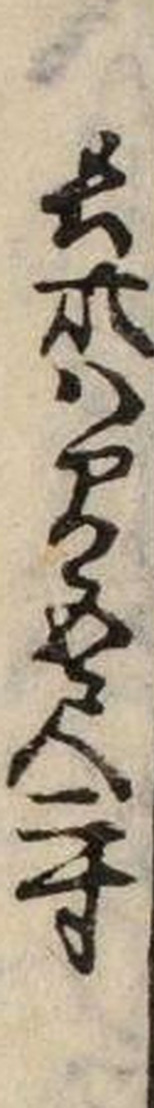長さ卅八間五尺二寸を
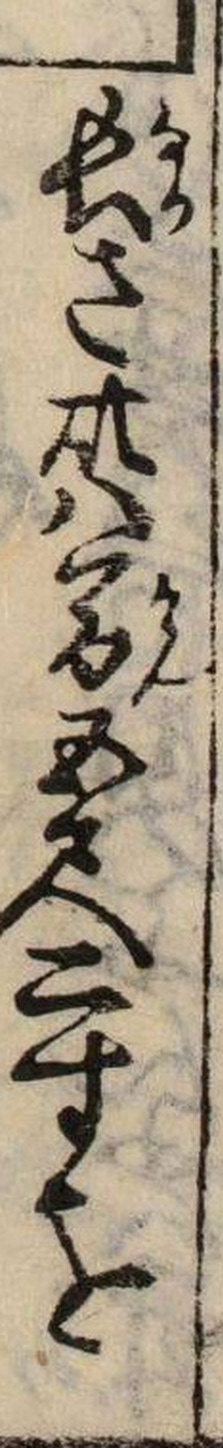長さ卅八間五尺二寸を
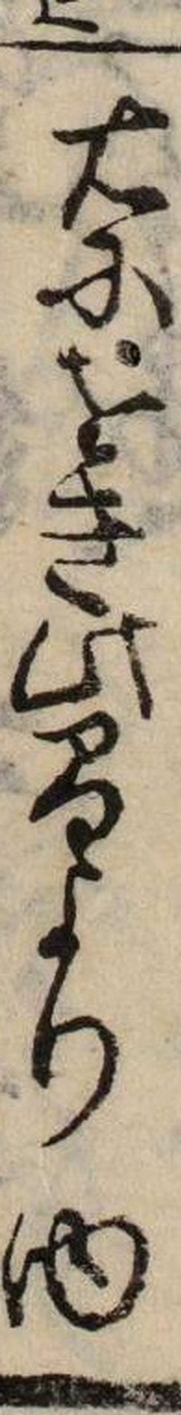右にをき此間より内
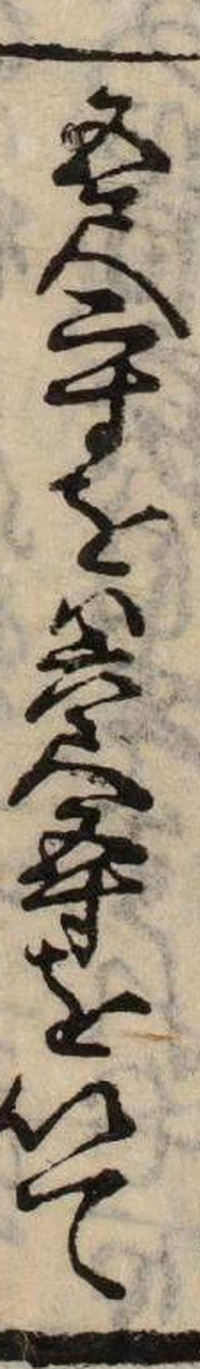五尺二寸をは六尺五寸を以て
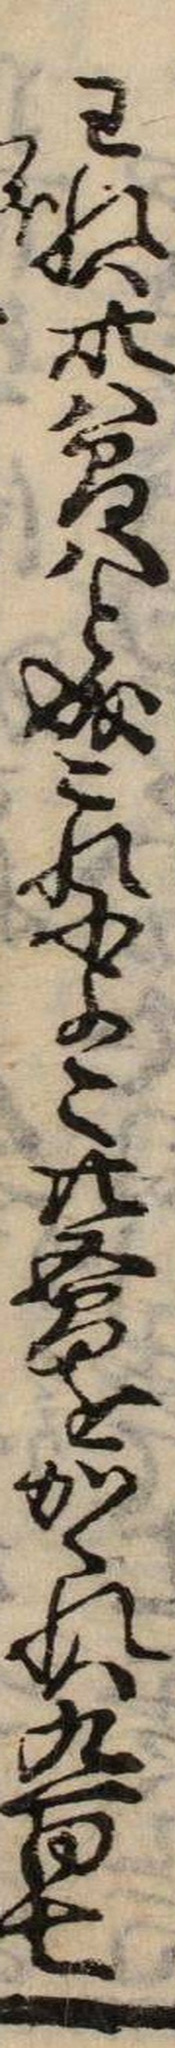われは卅八間はと成これによこ廿五間をかくれは九百七
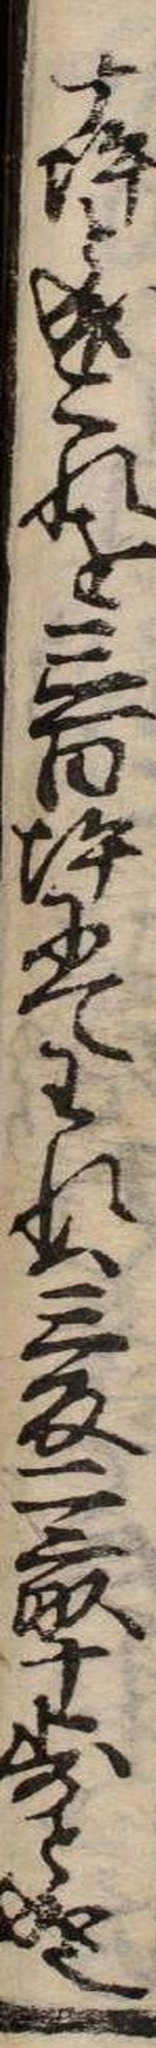十坪と成これを三百坪にてわれは三反二畝十歩と成也
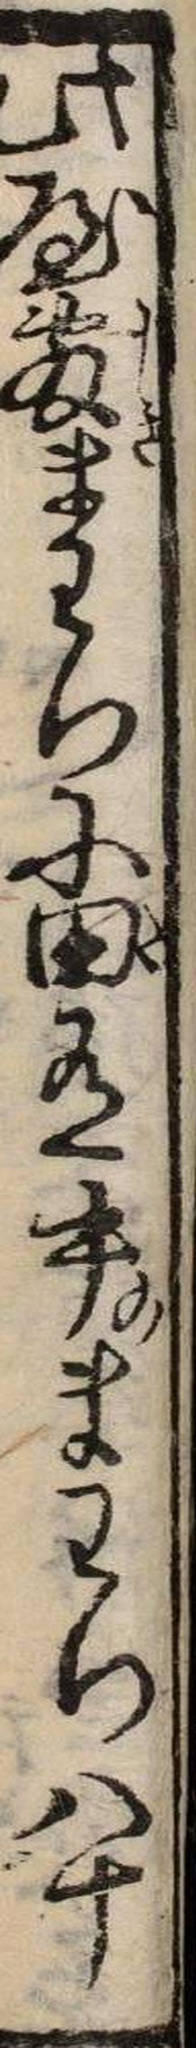此屋敷まわりに田有中のまわり八十
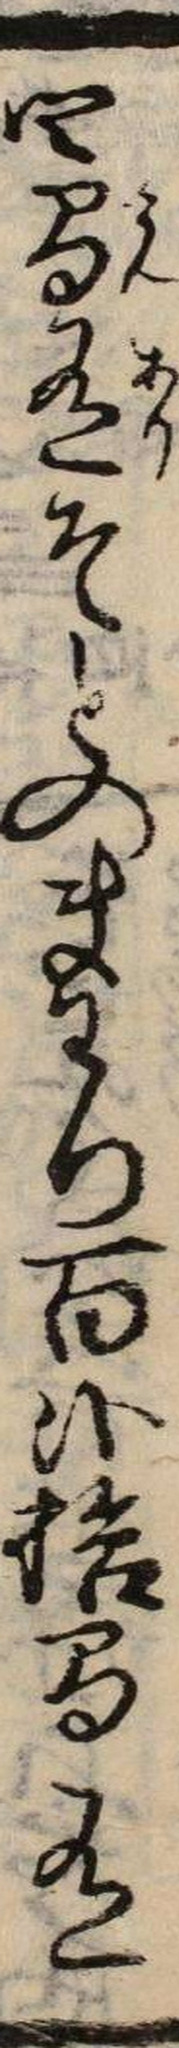四間有そとのまわり百弐拾間有
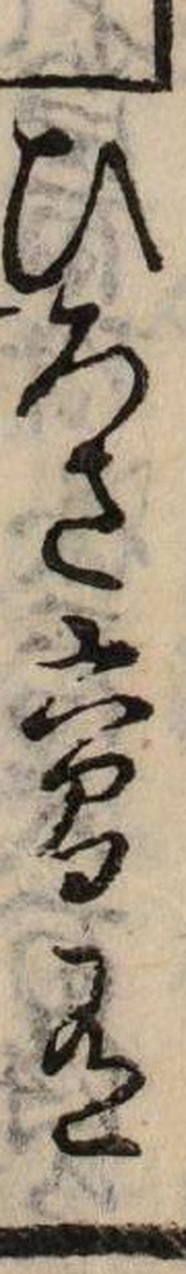ひろさ六間有
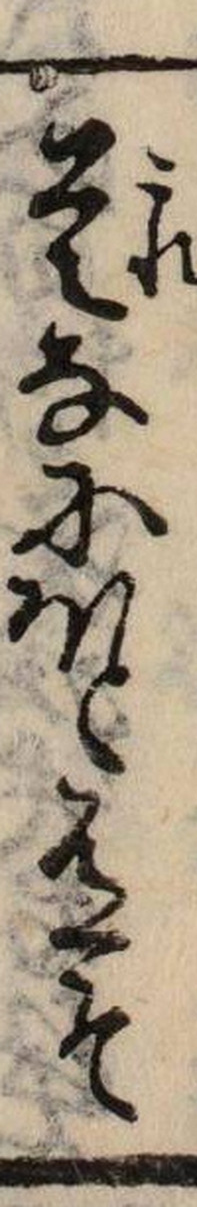是なにほと有そ
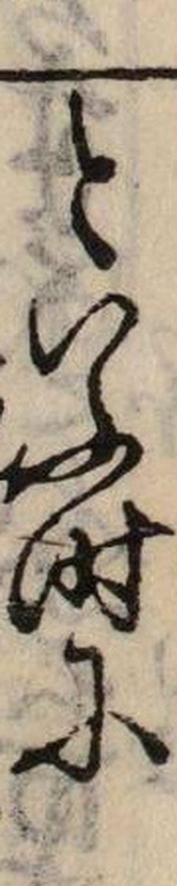といふ時に
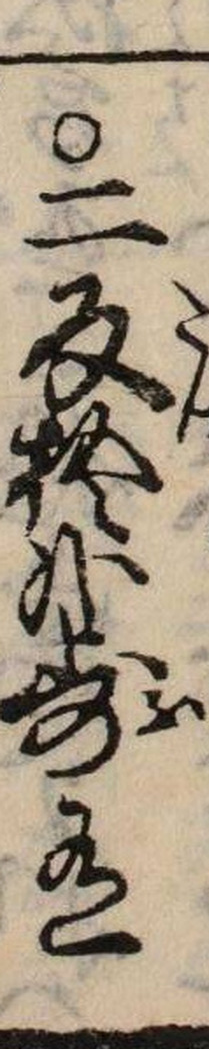○二反拾弐歩有
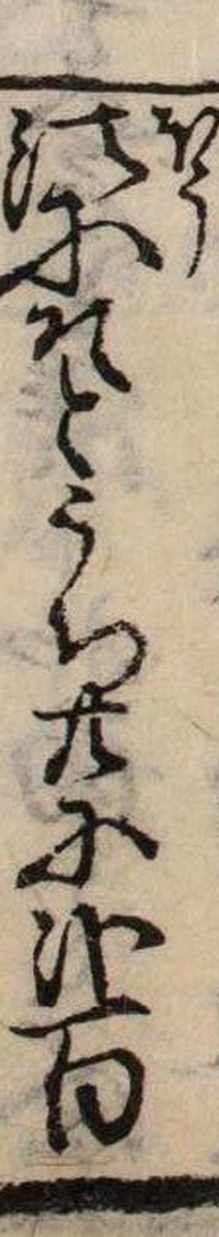法にそとうち共に弐百
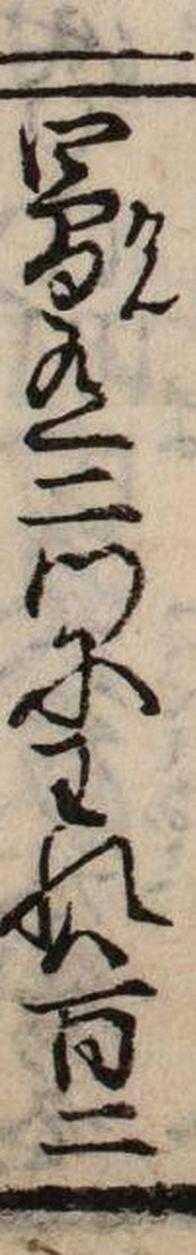四間有二つにわれは百二
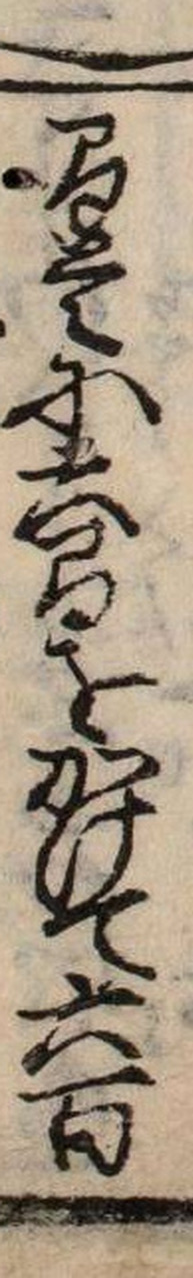間是に六間をかけて六百

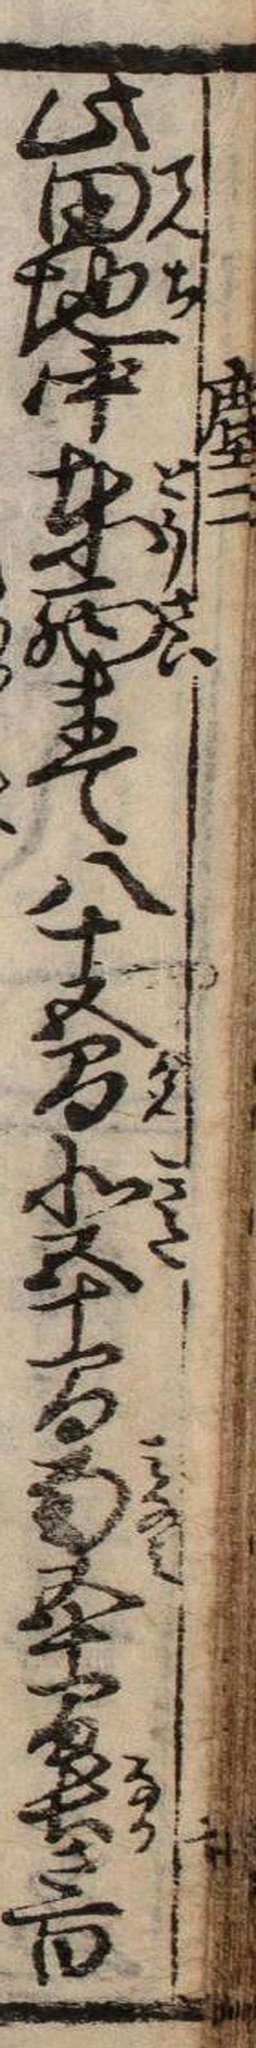此田地中東西まて八十五間北五十間南五十間長さ百
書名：塵劫記（寛永11年自跋、京都府立京都学・歴彩館追貴8）
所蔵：京都府立京都学・歴彩館 国文学研究資料館
